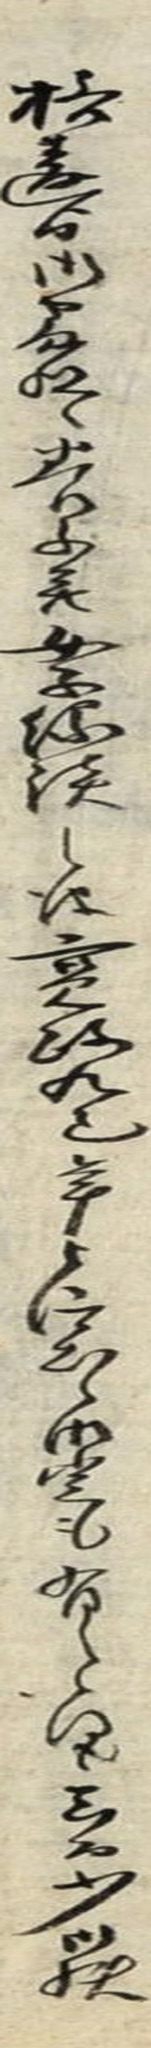格違ゟ御番組へ養子并女子縁談之儀寛政九巳年被仰出候御定も有之候得共至而少御扶
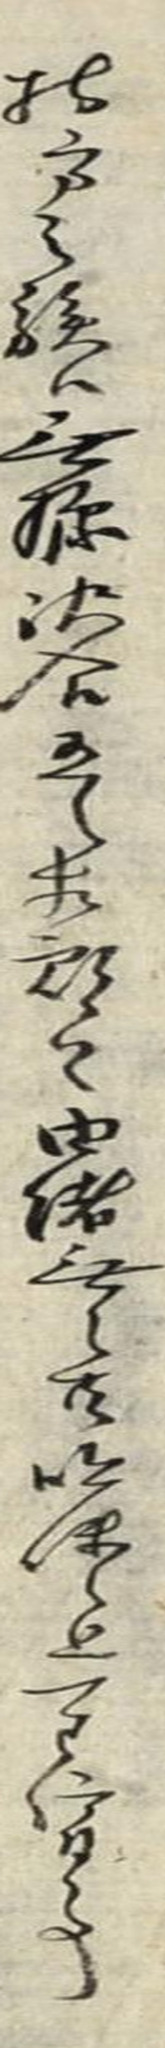持方之族ハ無拠訳合有之相願候ハヽ由緒無之共吟味之上可被仰付事
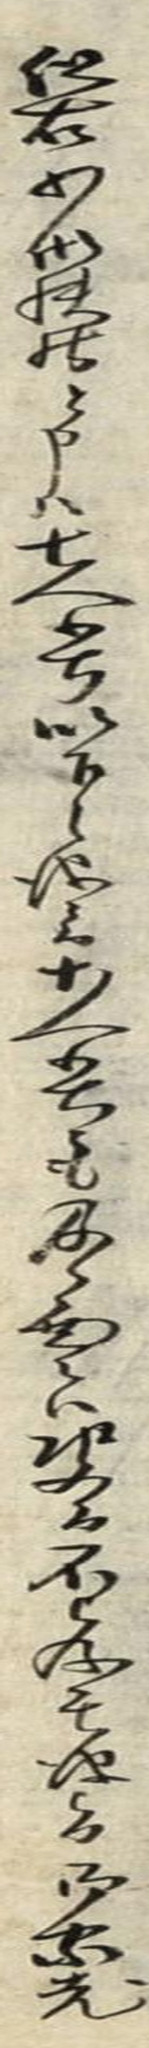但右少御扶持と申ハ七人ふち以下之儀ニ而十人ふちニも及候面々ハ決而不被及其儀旨御家老
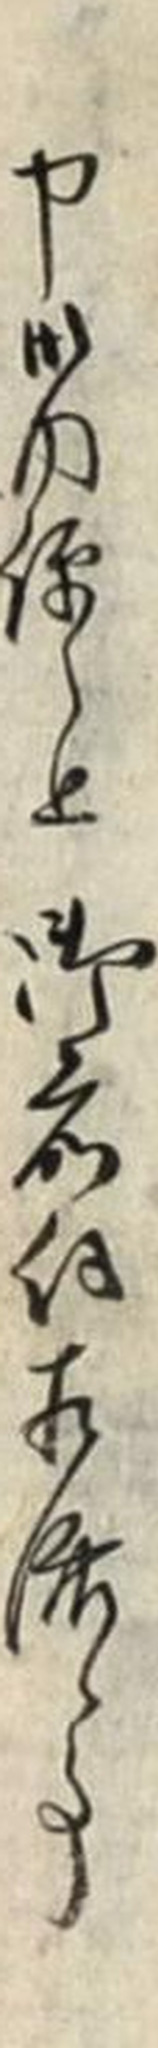中御内評之上御前伺相済候事
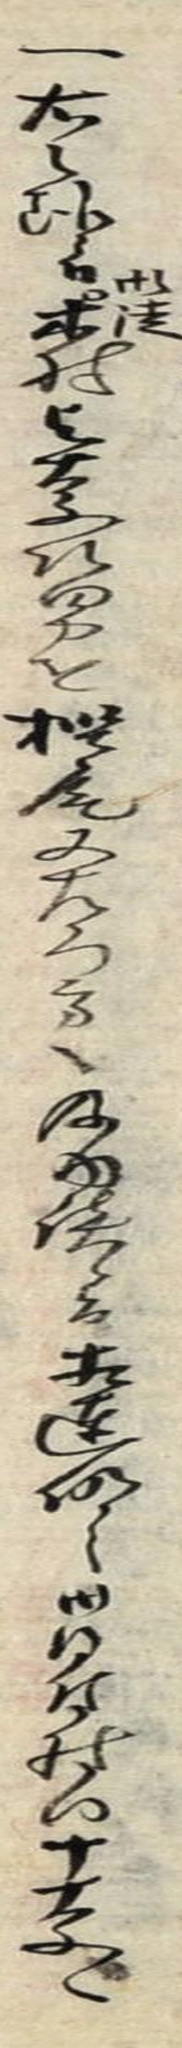一右之趣ニ而御徒木村与太夫次男を樫尾又左衛門方ヘ及内談候旨相達仍之御目付村田十太夫ヘ
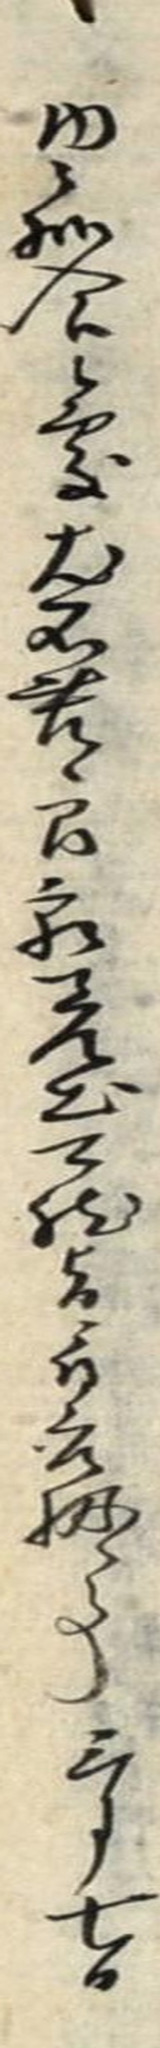内々掛合候處尤不苦候間願差出可然旨ニ付取扱候事三月七日

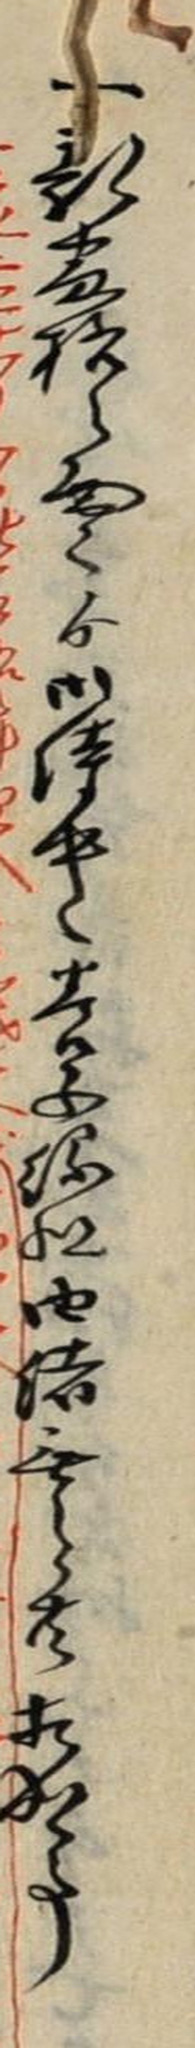一新番格之面々ゟ御侍中ヘ養子縁組由緒無之候共相成候事
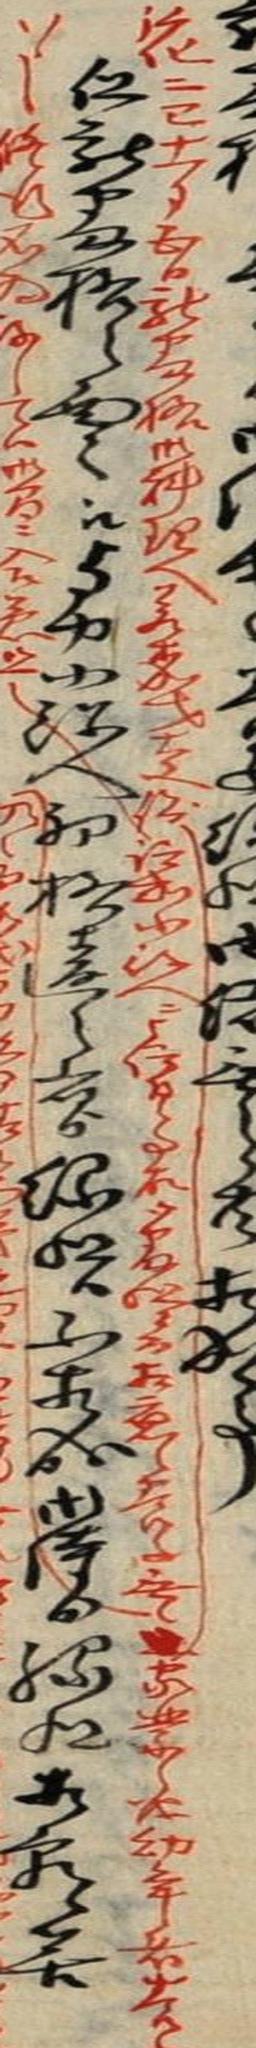但新番格之面々江与力小役人初格違之者ゟ縁組ハ不相成御侍ゟ縁組相願候筈
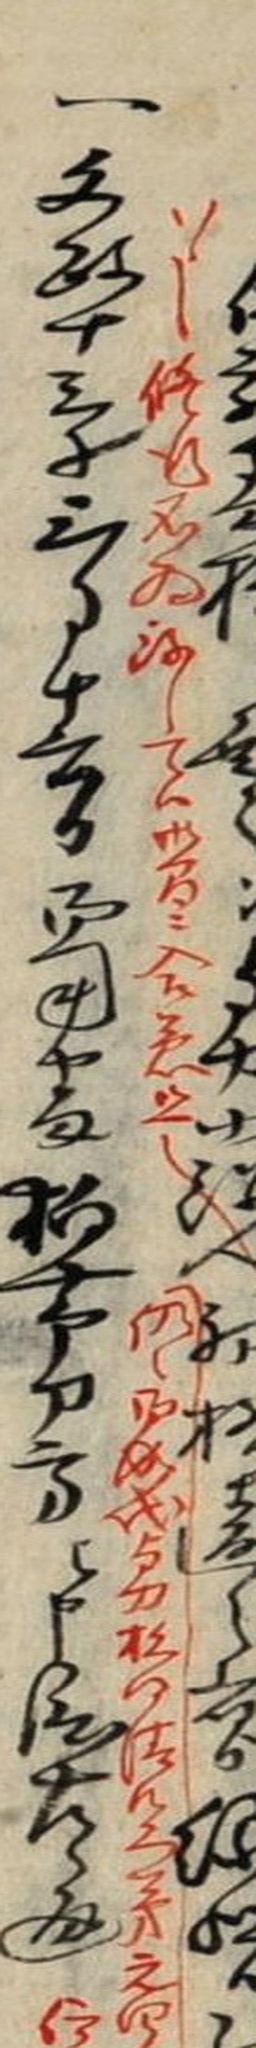一文政十三寅三月十六日御用番狛帯刀方被申渡左之通
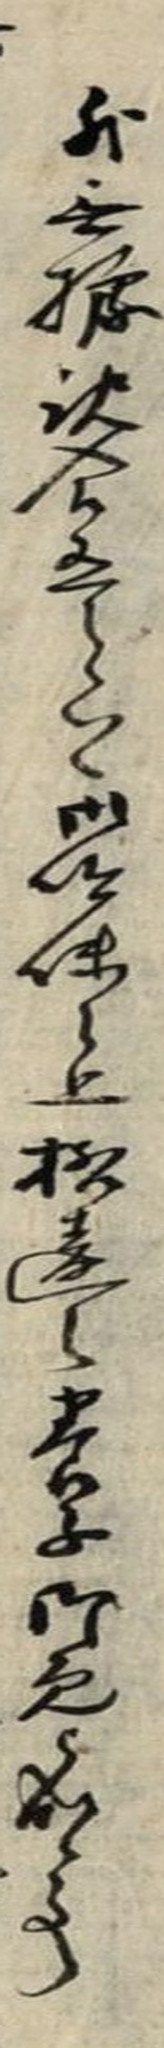外無拠訳合有之候ハヽ御吟味之上格違之養子御免被成候事
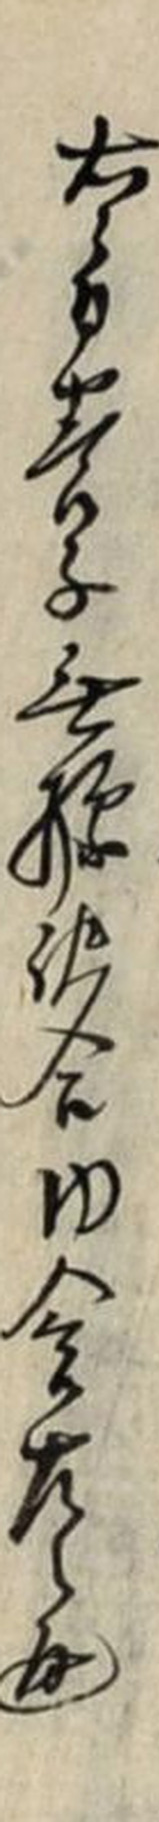右ニ付養子無拠訳合内含左之通
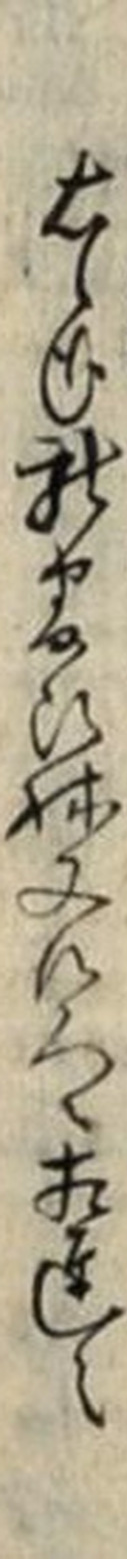右之通新番頭林又左衛門ヘ相達
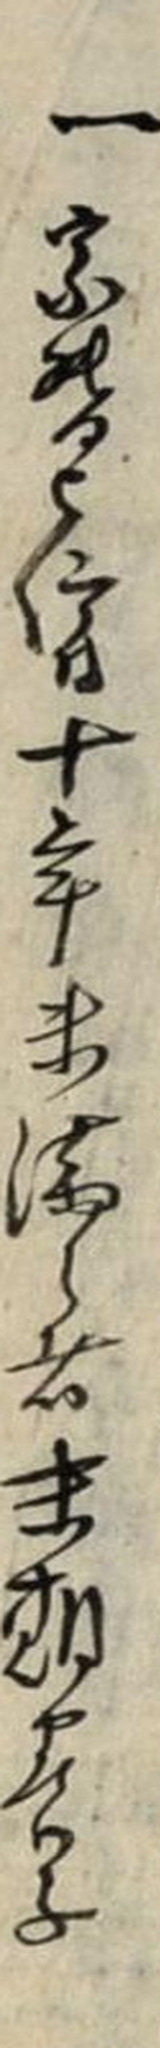一家督被仰付十年未満之者末期養子
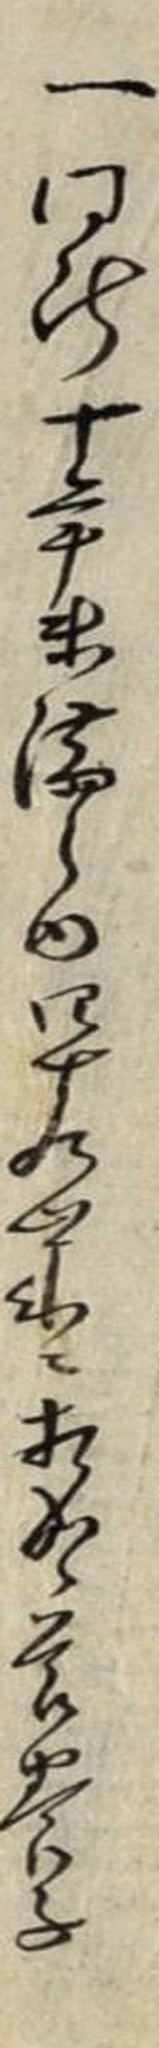一同断十年未満之内四十九歳ニ相成候節養子
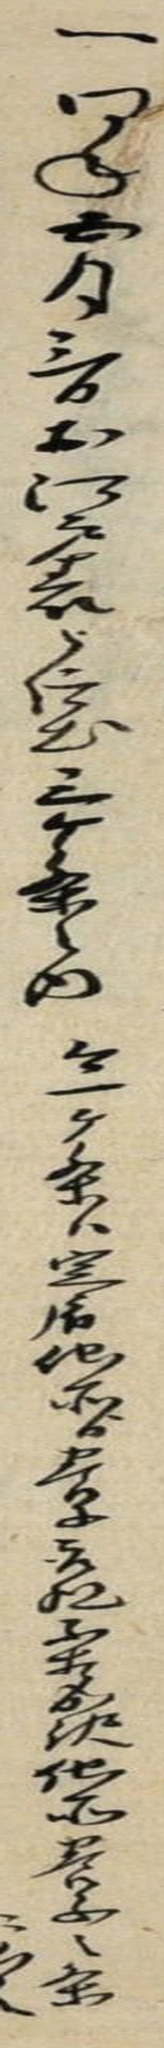一同年五月三日於江戸表被仰出三ヶ条之内今一ヶ条ハ定府他所ゟ養子取組不相成訳他所養子之条ニ出之
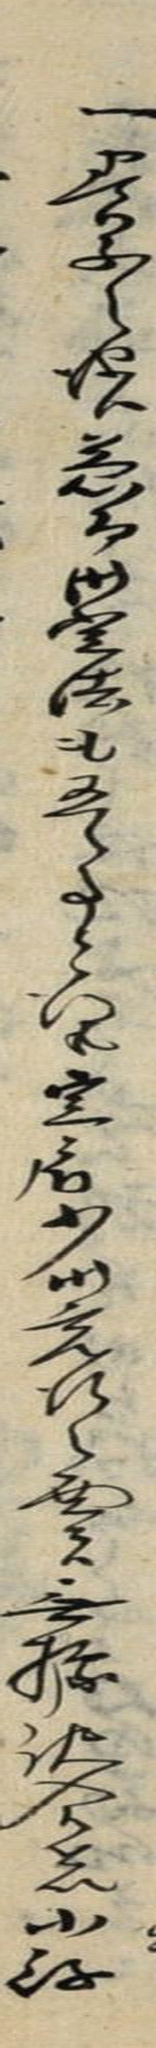一養子之儀ハ兼而御定法も有候事ニ候得共定府少御充行之面々ハ無拠訳合を以小役
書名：養子縁組之部
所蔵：福井県文書館 Fukui Prefectural Archives
